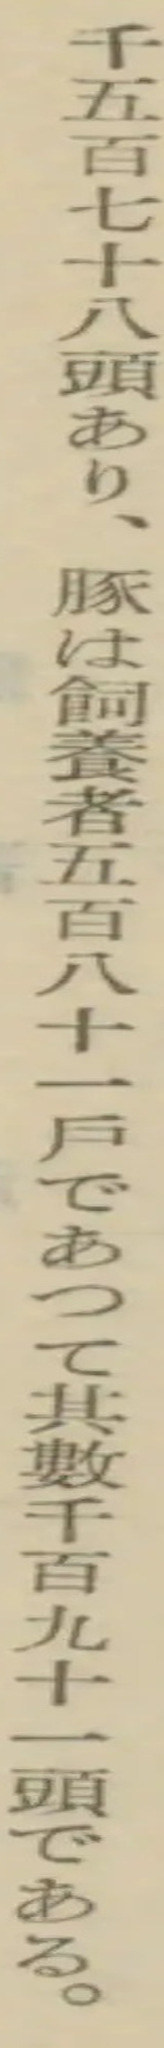千五百七十八頭あり、豚は飼養者五百八十一戸であつて其数千百九十一頭である。
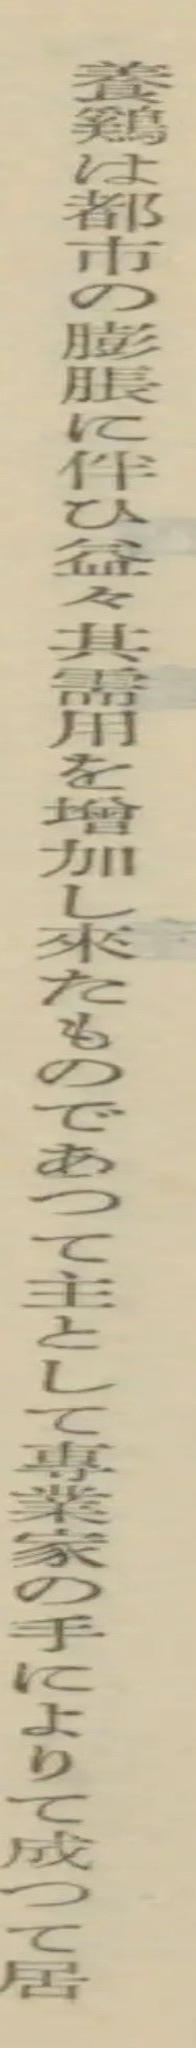養鶏は都市の膨脹に伴ひ益々其需用を増加し来たものであつて主として専業家の手によりて成つて居
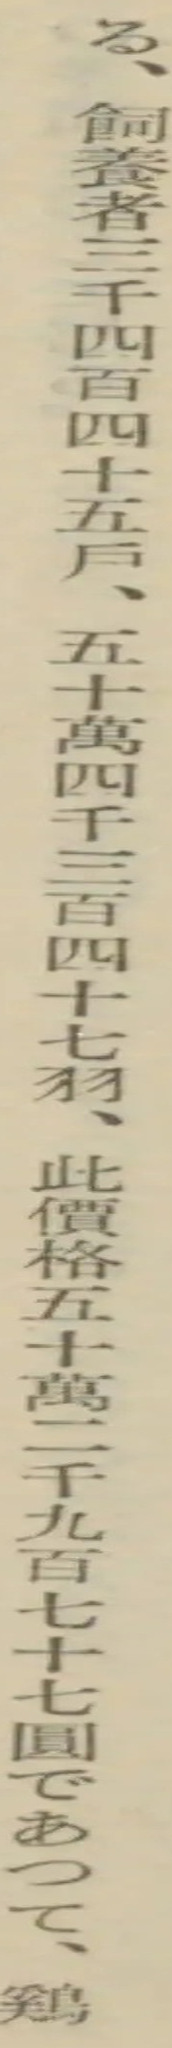る、飼養者三千四百四十五戸、五十万四千三百四十七羽、此価格五十万二千九百七十七円であつて、鶏
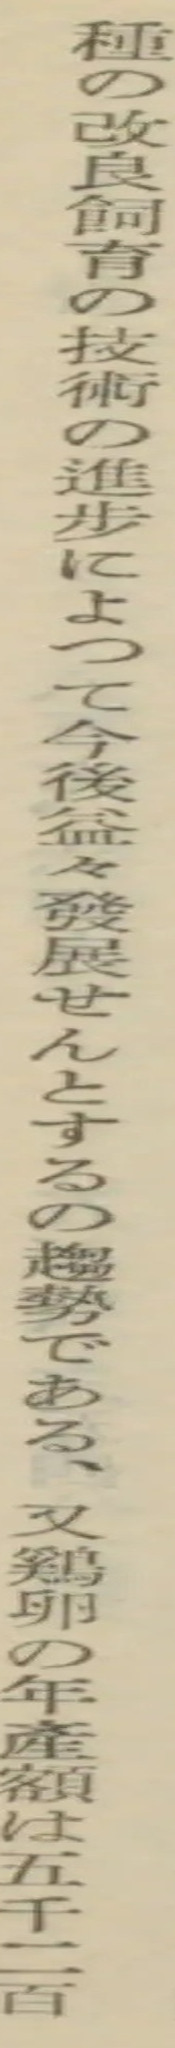種の改良飼育の技術の進歩によつて今後益々発展せんとするの趨勢である、又鶏卵の年産額は五千二百
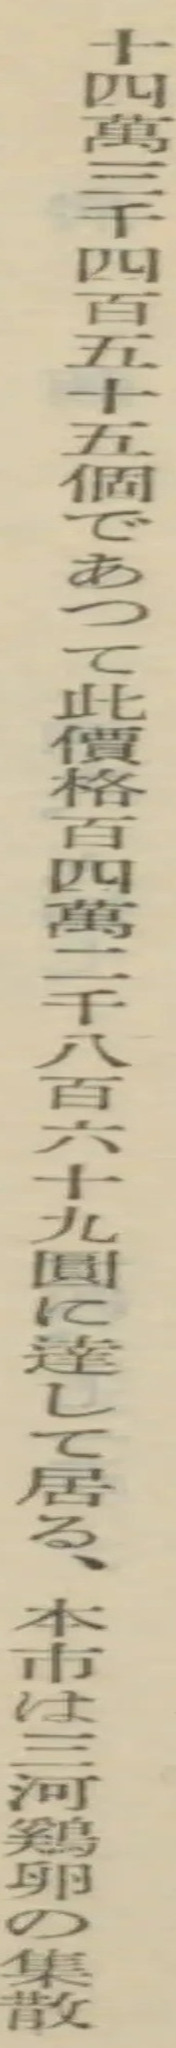十四万三千四百五十五個であつて此価格百四万二千八百六十九円に達して居る、本市は三河鶏卵の集散
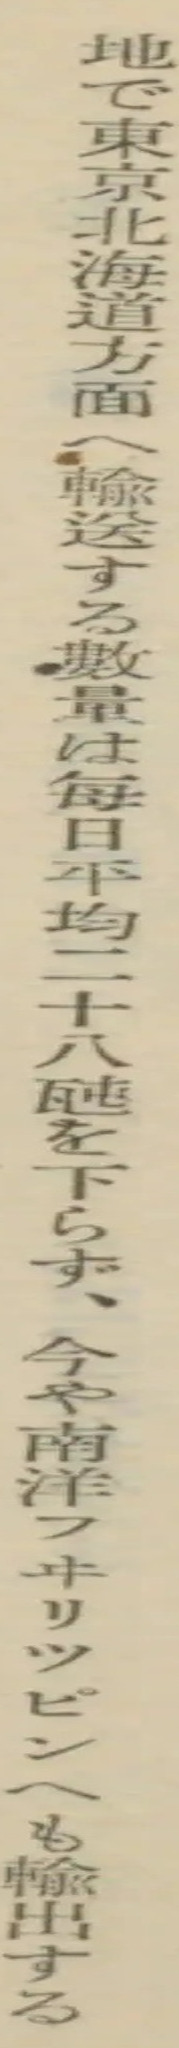地で東京北海道方面へ輸送する数量は毎日平均二十八瓲を下らず、今や南洋フヰリツピンへも輸出する
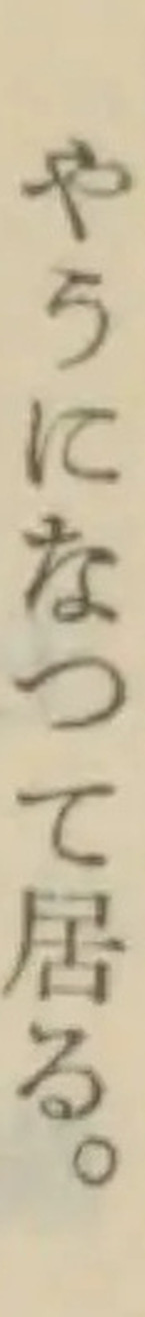やうになつて居る。
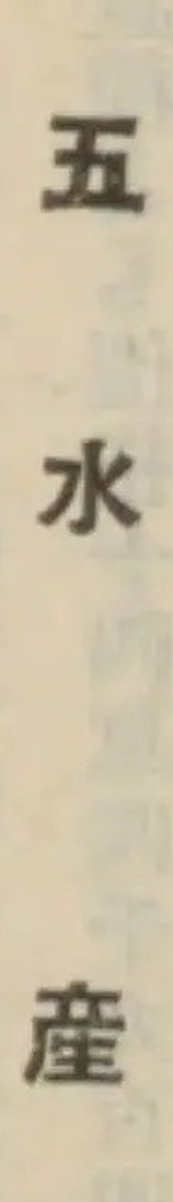五水産
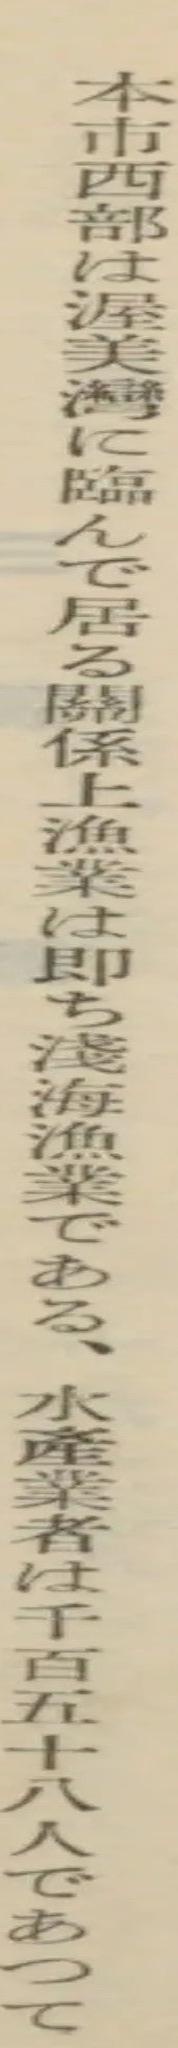本市西部は渥美湾に臨んで居る関係上漁業は即ち浅海漁業である、水産業者は千百五十八人であつて
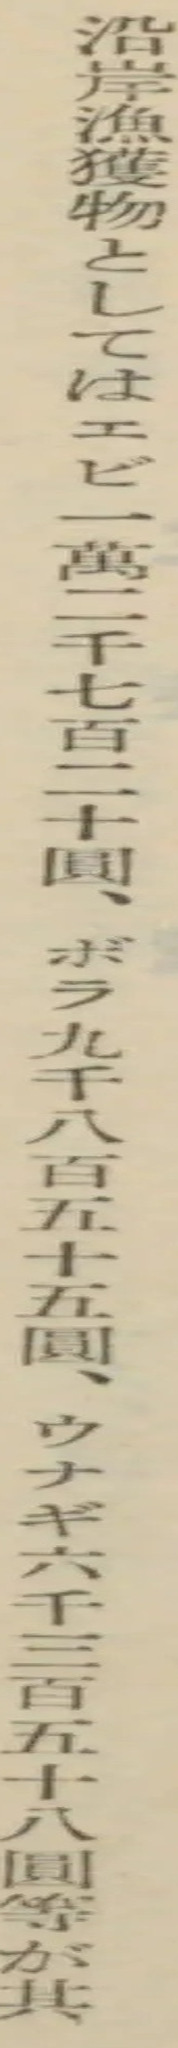沿岸漁獲物としてはエビ一万二千七百二十円、ボラ九千八百五十五円、ウナギ六千三百五十八円等が其
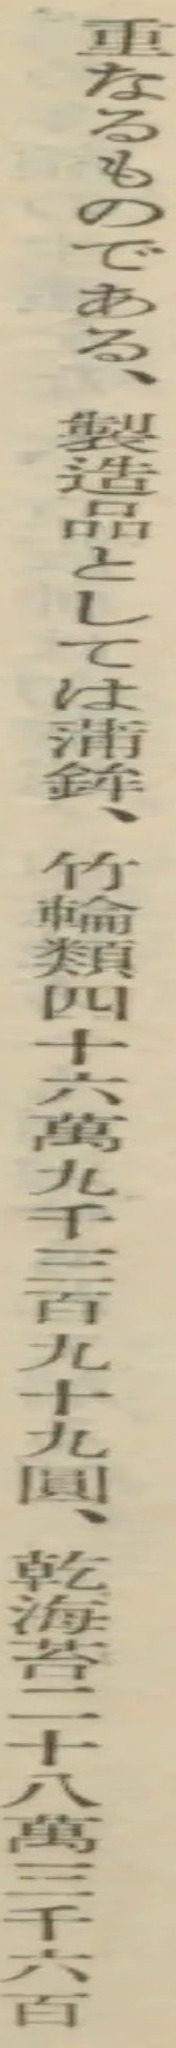重なるものである、製造品としては蒲鉾、竹輪類四十六万九千三百九十九円、乾海苔二十八万三千六百
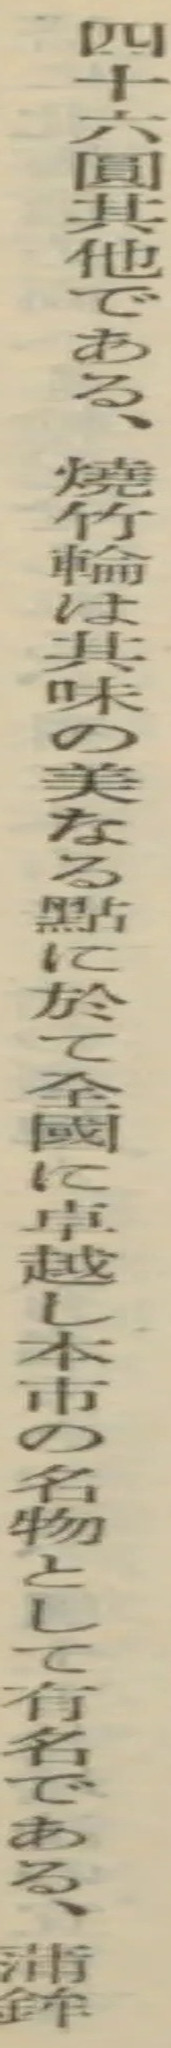四十六円其他である、焼竹輪は其味の美なる点に於て全国に卓越し本市の名物として有名である、蒲鉾
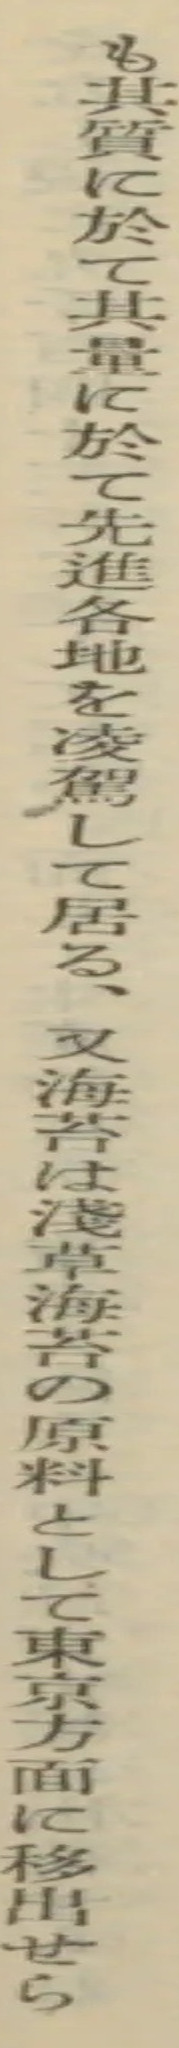も其質に於て其量に於て先進各地を凌駕して居る、又海苔は浅草海苔の原料として東京方面に移出せら
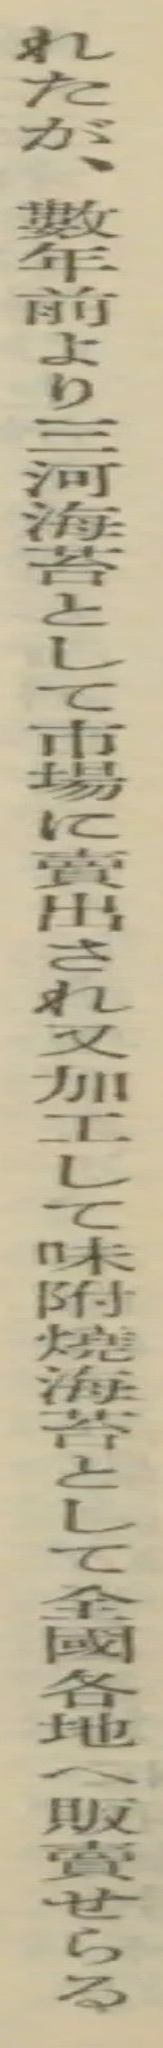れたが、数年前より三河海苔として市場に売出され又加工して味附焼海苔として全国各地へ販売せらる
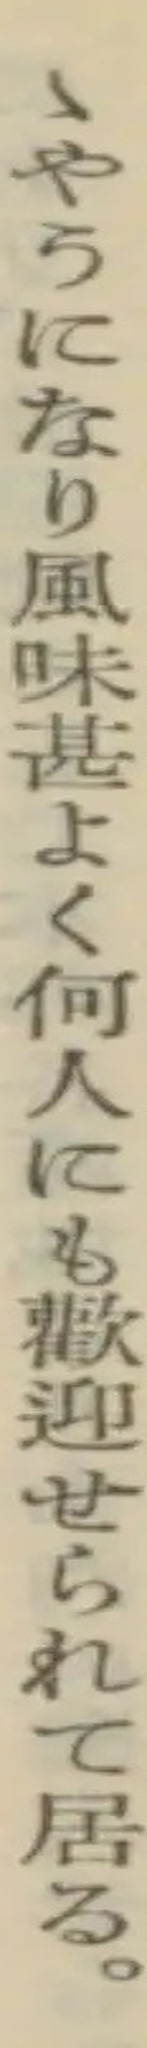ゝやうになり風味甚よく何人にも歓迎せられて居る。
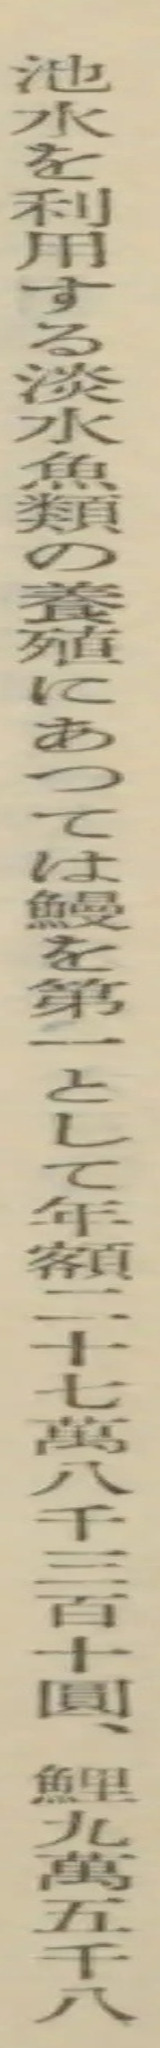池水を利用する淡水魚類の養殖にあつては鰻を第一として年額二十七万八千三百十円、鯉九万五千八
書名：産業の豊橋
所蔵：国立国会図書館 National Diet Library, JAPAN
